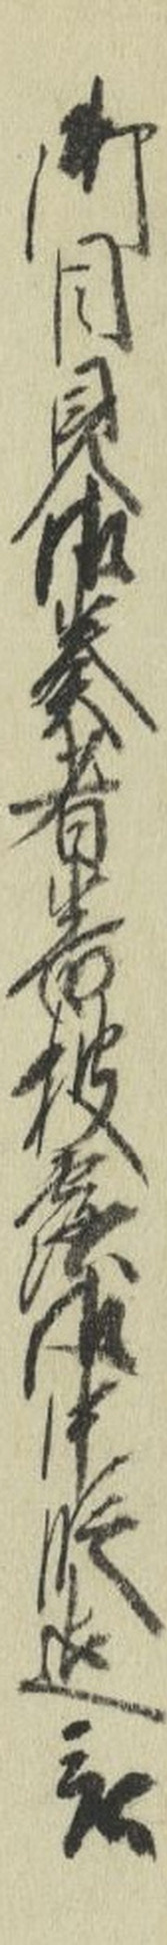御目見御奏者番披露御中段迄被
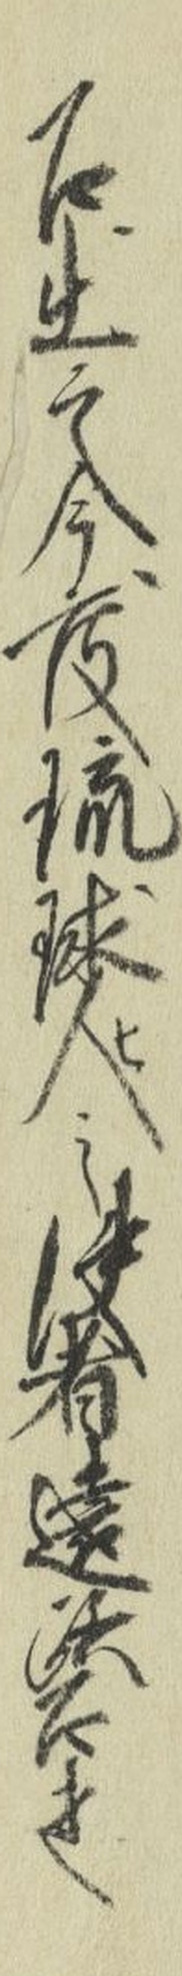召出之今度琉球人之使者遠路召連
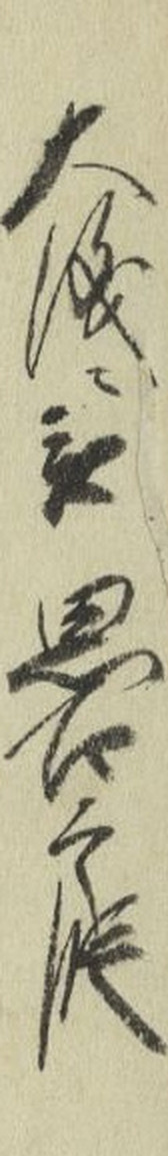大儀に被思召之段
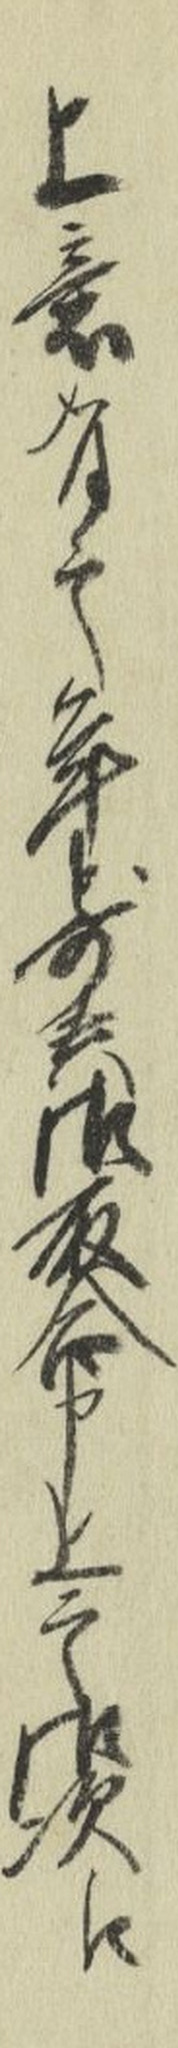上意有之年寄共御取合申上之御次え
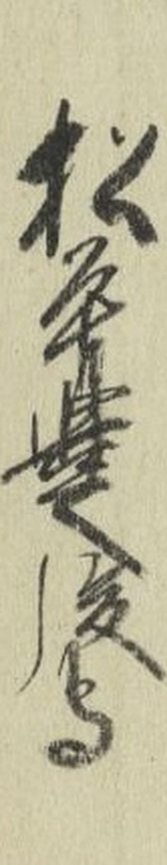松平豊後守
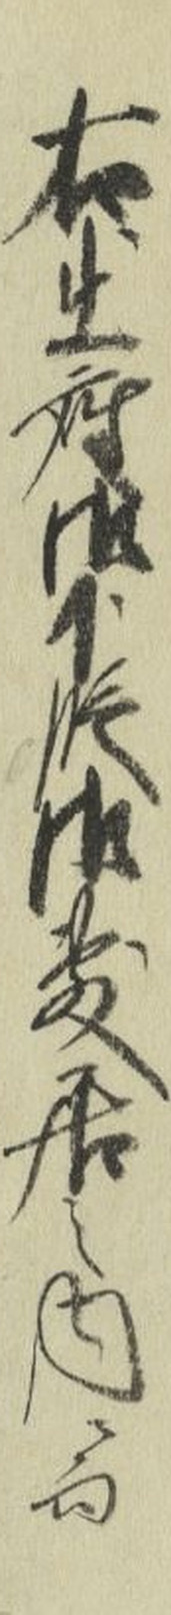右出座御下段御敷居之内に而

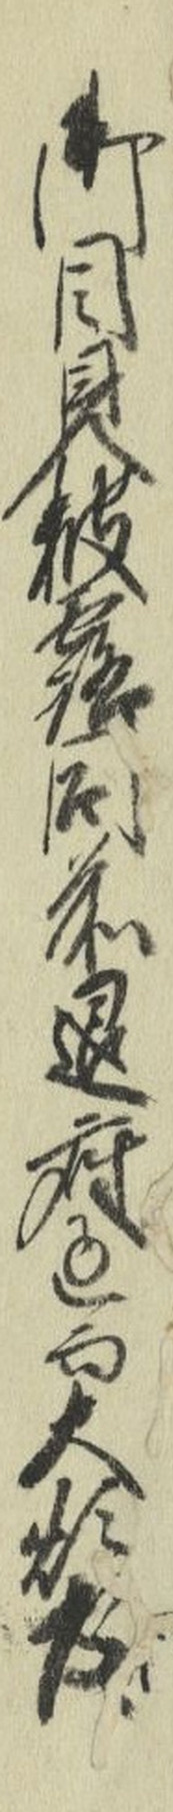御目見披露同前退座過而大炊方
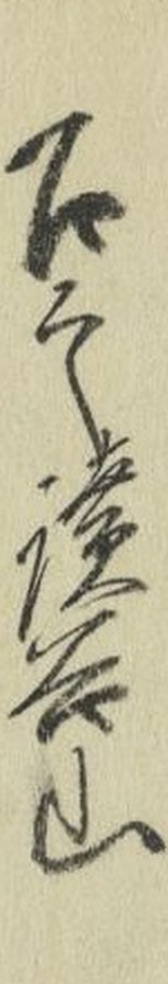召之読谷山
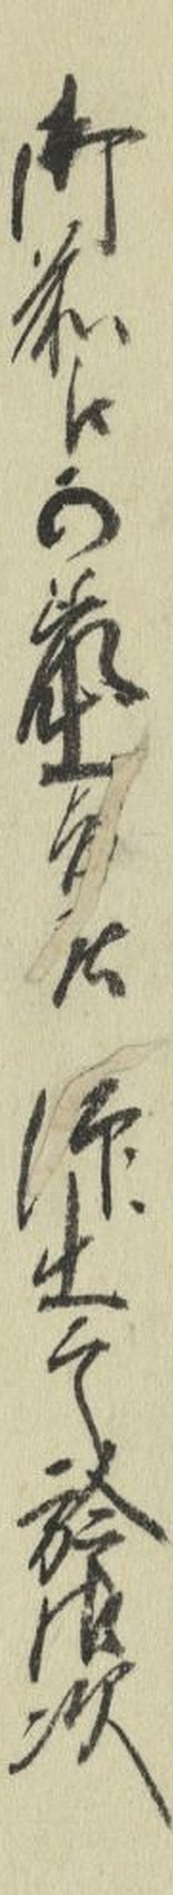御前え可差出旨被仰出之於御次
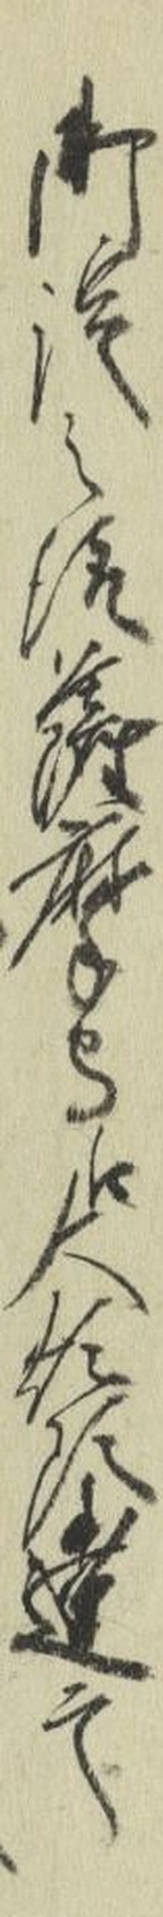御詫之趣薩摩守え大炊頭達之
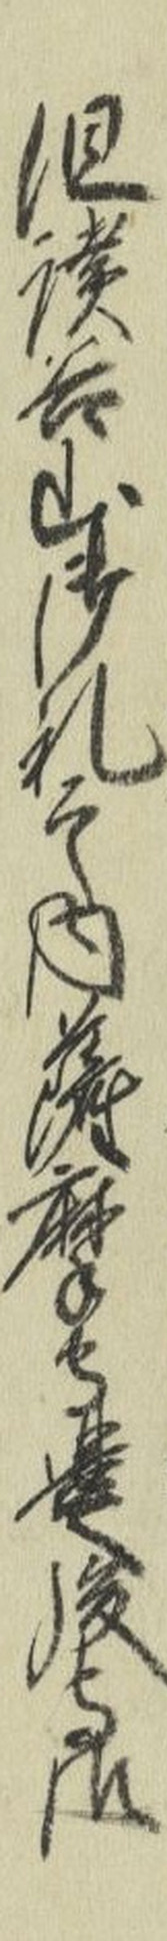但読谷山御礼之内薩摩守豊後守御
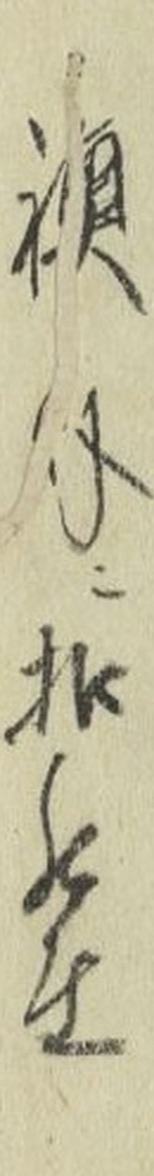襖内に控罷在
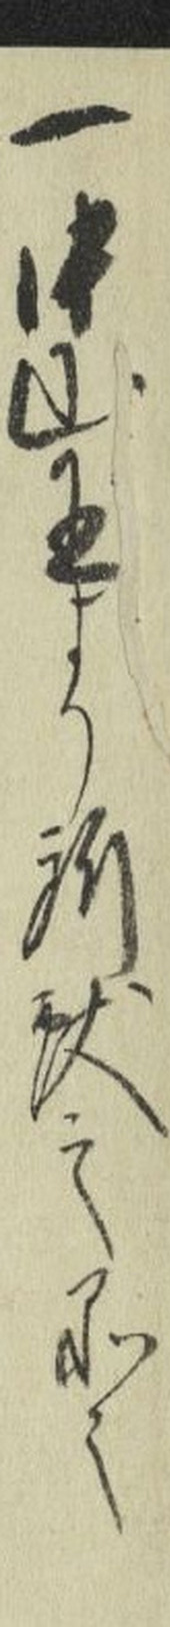一中山王より所献之品々
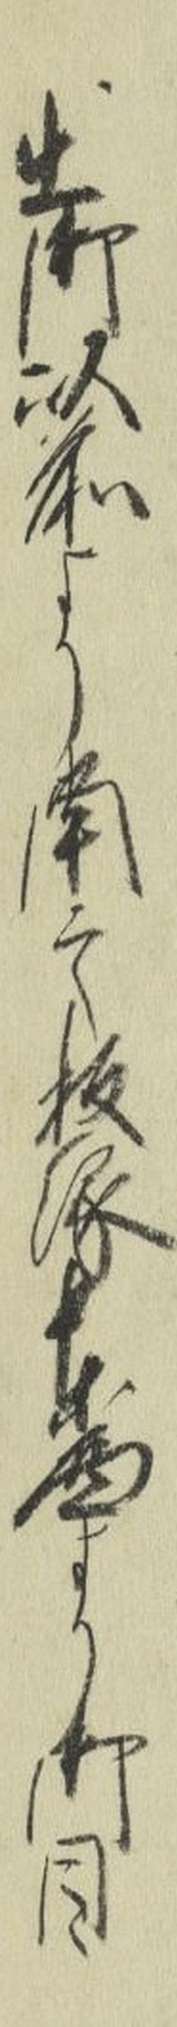出御以前より南之板縁東西より御目
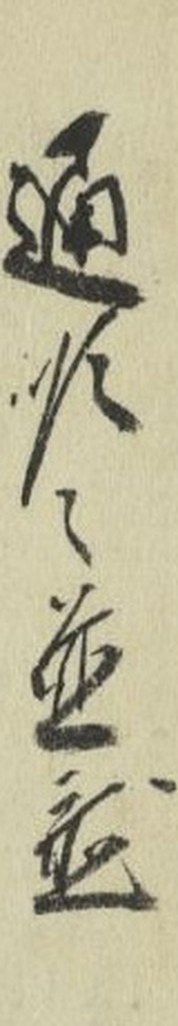通順々並置
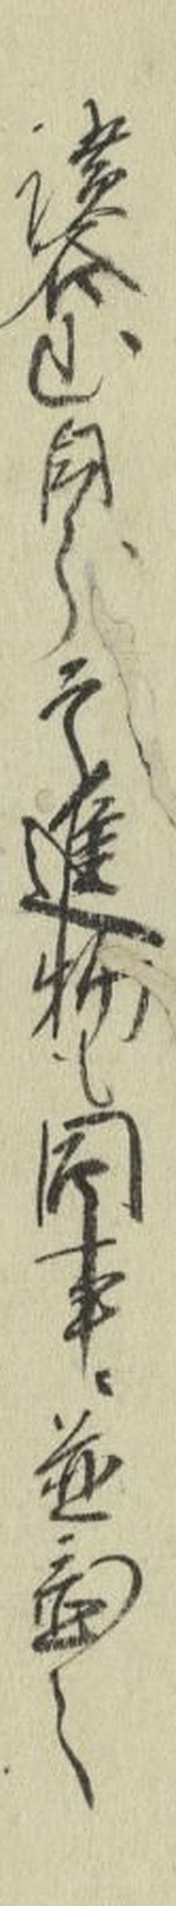読谷山自分之進物も同事に並置之
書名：琉球人御礼の次第
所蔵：University of the Ryukyus Library
